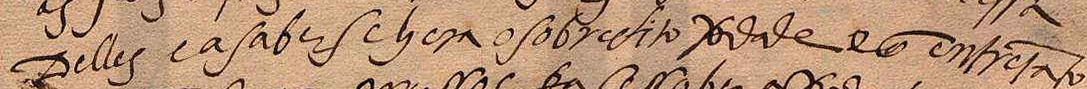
Delles e a saber se hera o sobredito ꝟdade e q̄ entretāto
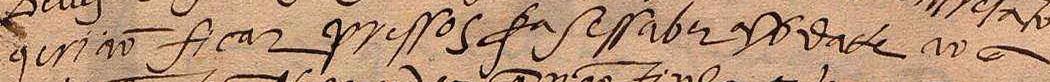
qeriaõ ficar pressos ꝑa se ssaber a ꝟdade ao q̄
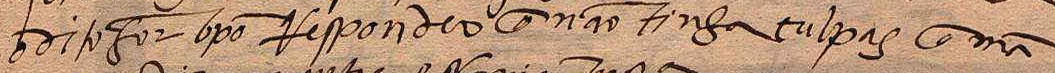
o dito s̄or bpō Respondeo q̄ não tinha culpas q̄ mā
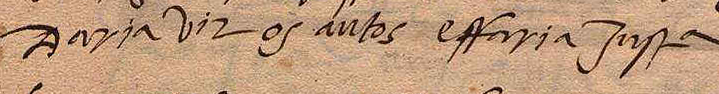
Daria vir os autos e ffaria Justa
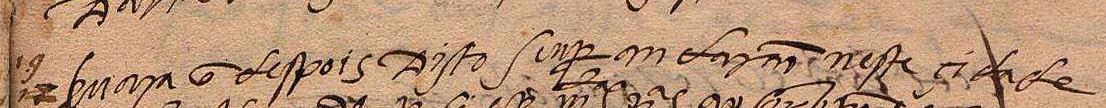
19 ꝓuara q̄ despois Disto senꝑ amdarão nesta çidade
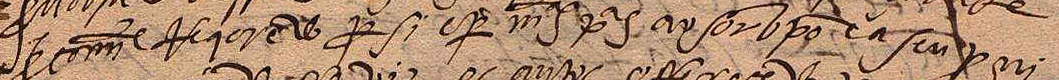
ꝓcam̄te Reqerēdo ꝑ si e ꝑ mtas pas. ao sōr bpō e a seu ꝓui
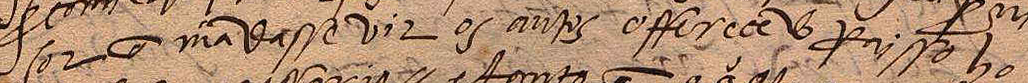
sor q̄ mādasse vir os autos offereçēdo ꝑa isso ho
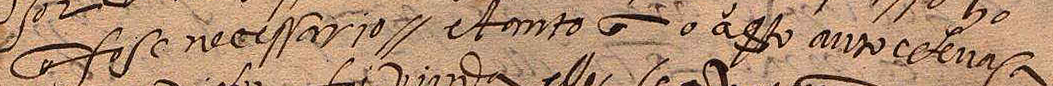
q̄ fose necessario // e tanto q̄ o a_to auto e deuasa
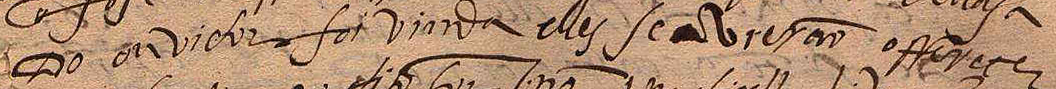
Do ouvidor foi vinda elles se _vierão offerecer
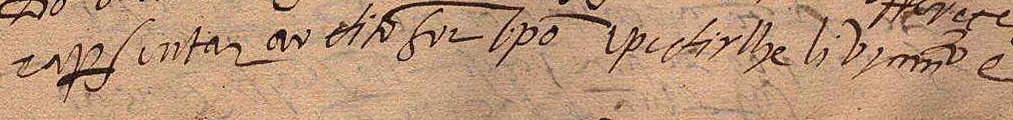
e aꝑsentar ao dito sōr bpō e pedirlhe livramto e
